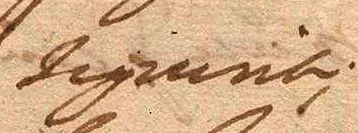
seguinte;
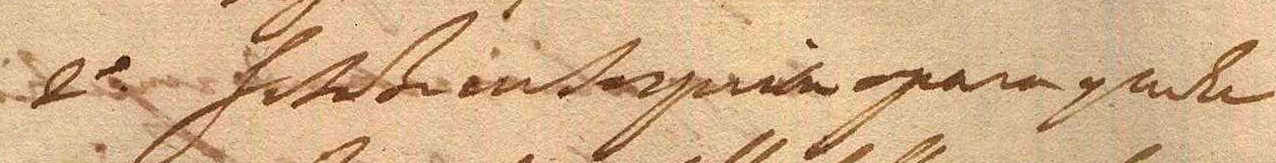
2o Se sabe ou sospeita o para que he
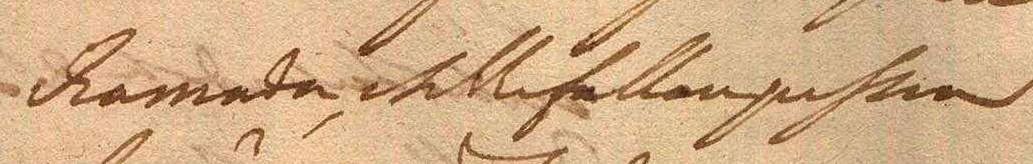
chamada, e se lhe fallou pessoa
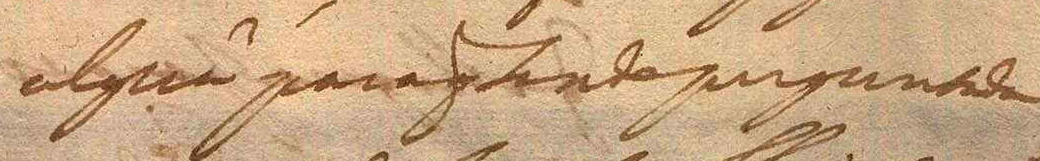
alguā para q̄ sendo perguntada
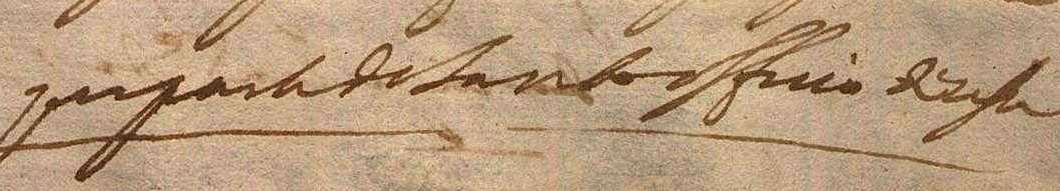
por parte do Santo officio dicesse
